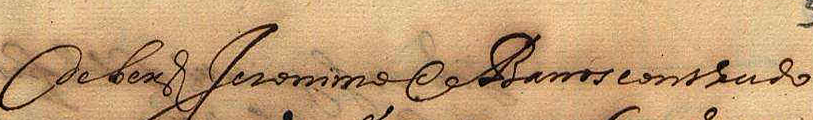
de bens Jeronimo de Barros contheudo
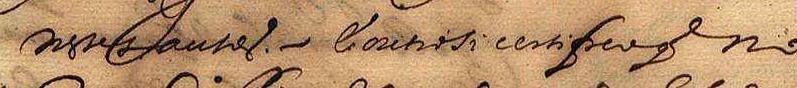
nestes autos. - E outrosi certifico q̄ no
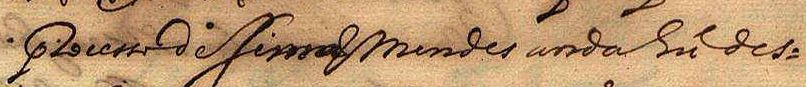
processo de Simaõ Mendes anda hū des
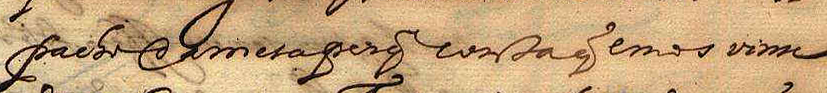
pacho da mesa perq̄ consta q̄ em os vinte
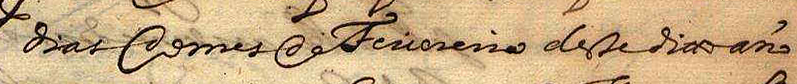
dias do mes de Feuereiro deste ditto an̄o
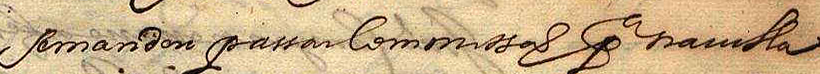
se mandou passar Commissaõ p̄a na uilla
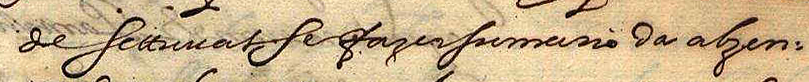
de Settuual se fazer sumario da alzen
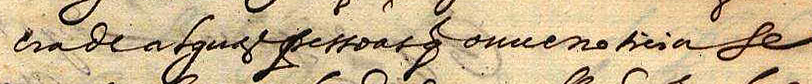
era de alguas pessoas q̄ ouue noticia se
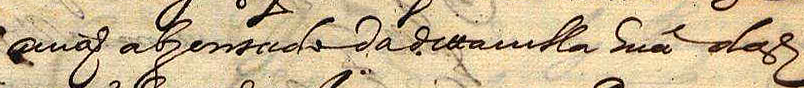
auiaõ abzentado da ditta uilla huā das
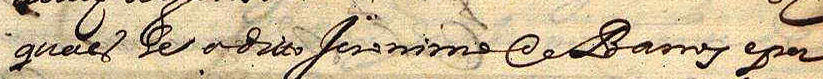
quaes he o ditto Jeronimo de Barros e por
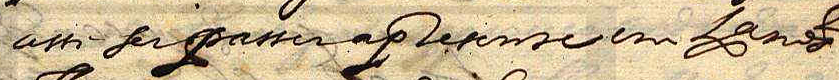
assi ser passer a presente em Lxa no s.to
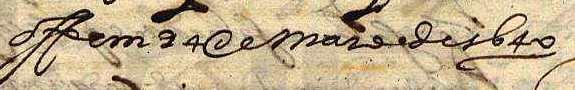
offo em 24 de maio de 1640.
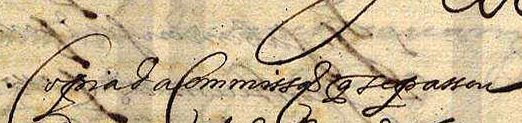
Copia da Commissaõ q̄ se passou
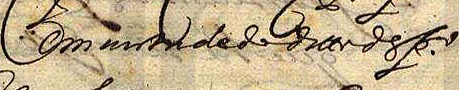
em uirtude do ditto desp.o
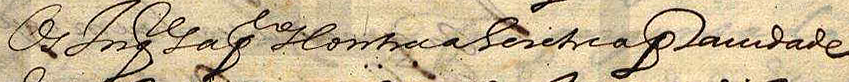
Os Inqres ap.cos contra a heretica prauidade
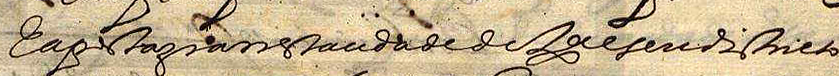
E apostazia nesta cidade de Lx e seu districto
